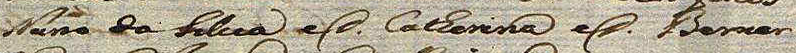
Nuno da Silua e D. Catherina e D. Bernar
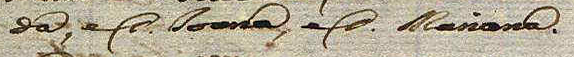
da, e D. Ioana, e D. Mariana.
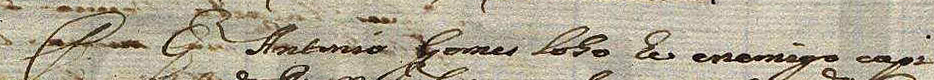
P Q̄ Antonio Gomes lobo he enemigo capi
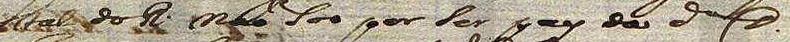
tal do R. naõ soo por ser pay da da D.
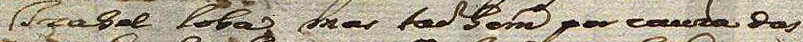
Izabel loba mas taõbem por cauza das
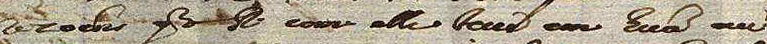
Rezoen̄s q̄ o R com elle teue em huā au
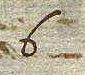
6
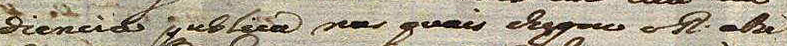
diencia publica nas quais chegou o R. a lhe
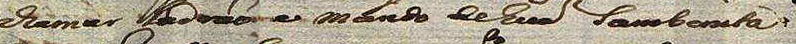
chamar ladrão e marido de huā sambenita
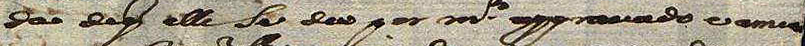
da de q̄ elle se deo por m.to aggravado e amea
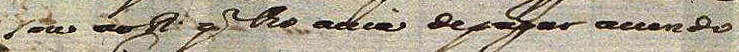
sou ao R. q̄ lho auia de pagar auendo
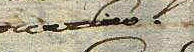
occazião.
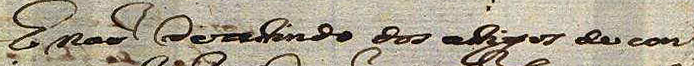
E naõ dezestindo dos artigos de con
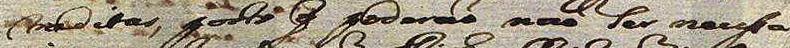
traditas, posto q̄ poderão naõ ser necessa
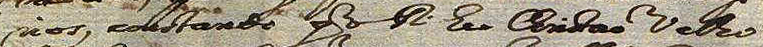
rios, constando q̄ o R. he Christaõ Velho
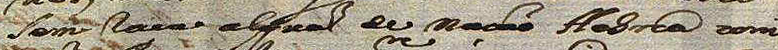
sem Raça alguā de nação Hebrea com
